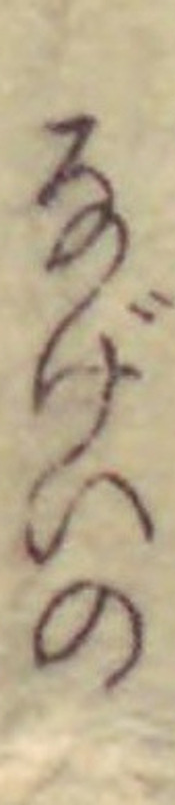なげいの
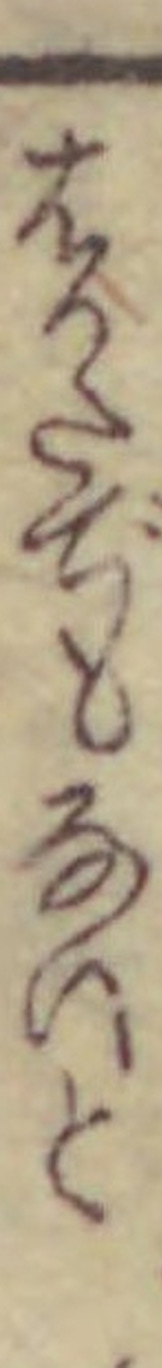はかたでもないと
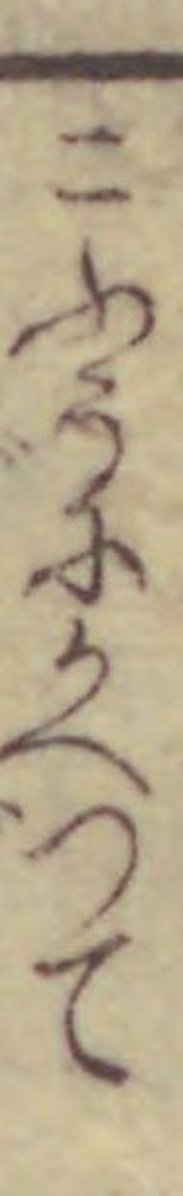こふうにかへつて
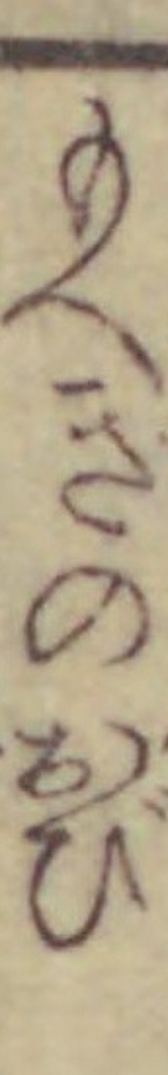もへぎのおび
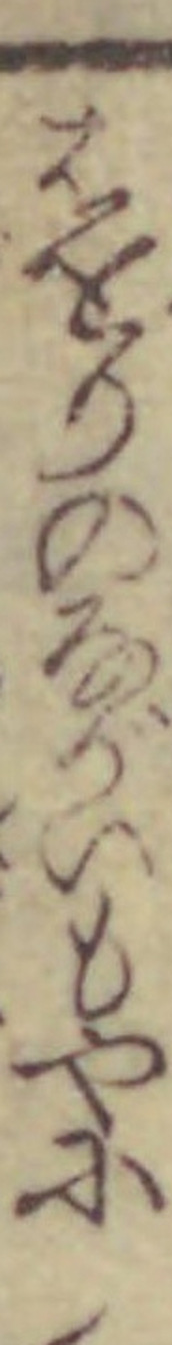はをりのながいもやに
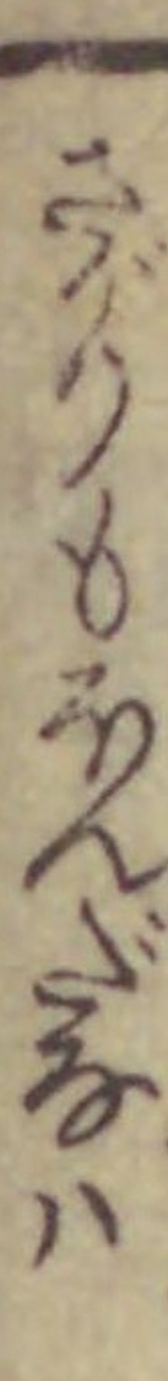さがりもほんだなは
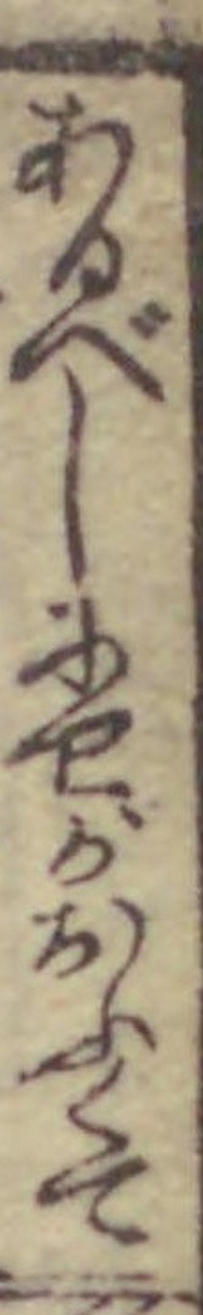あるべしにせがおふくて
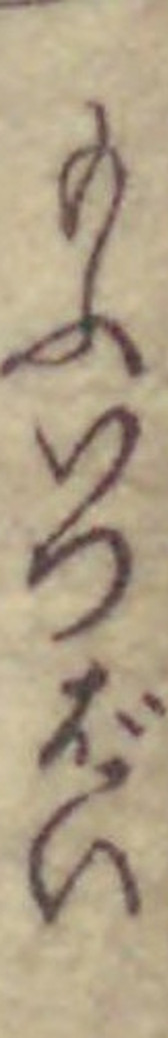もふいつばい
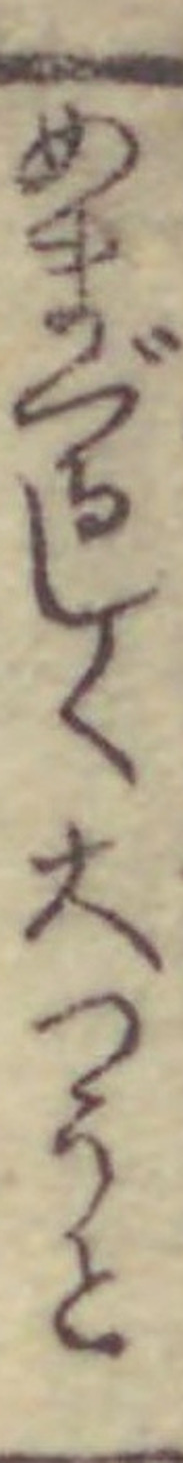めまぐるしく大つうと
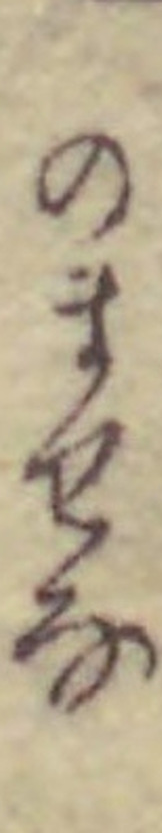のませな
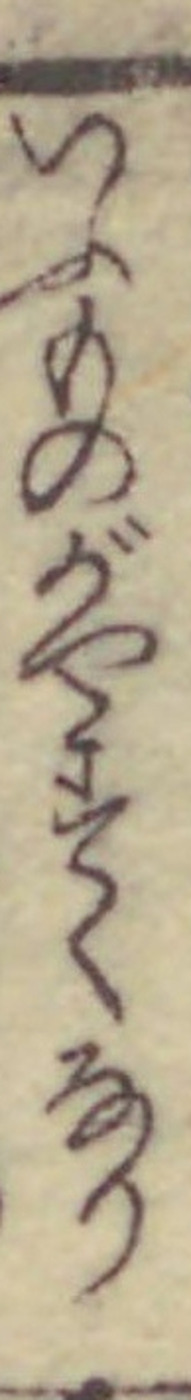いふものがやすくなり
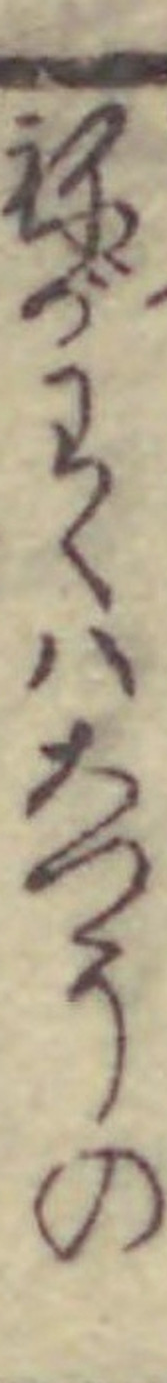ねがわくは大つうの
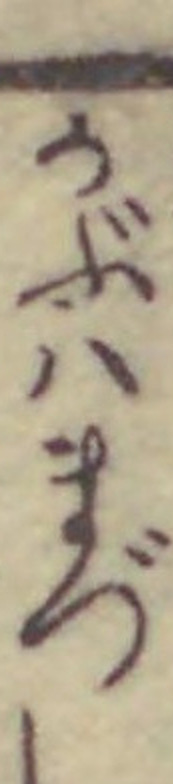かぶはまづ
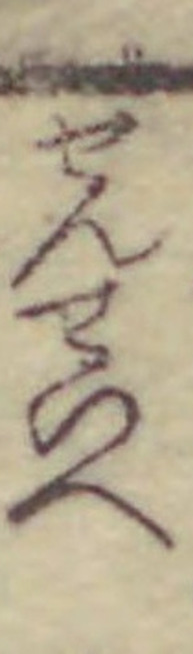せんせいへ
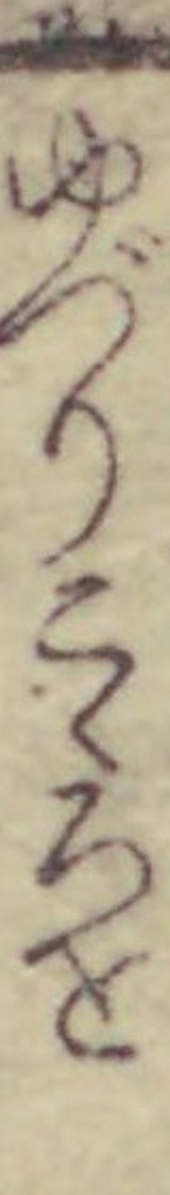ゆづりこゝろを
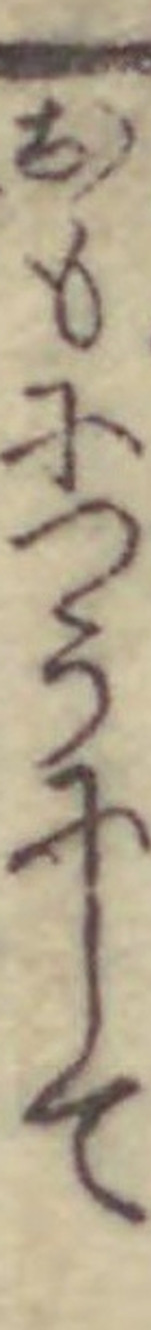おもにつうにして
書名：大通人穴[サガシ] 3巻
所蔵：国立国会図書館 National Diet Library, JAPAN
